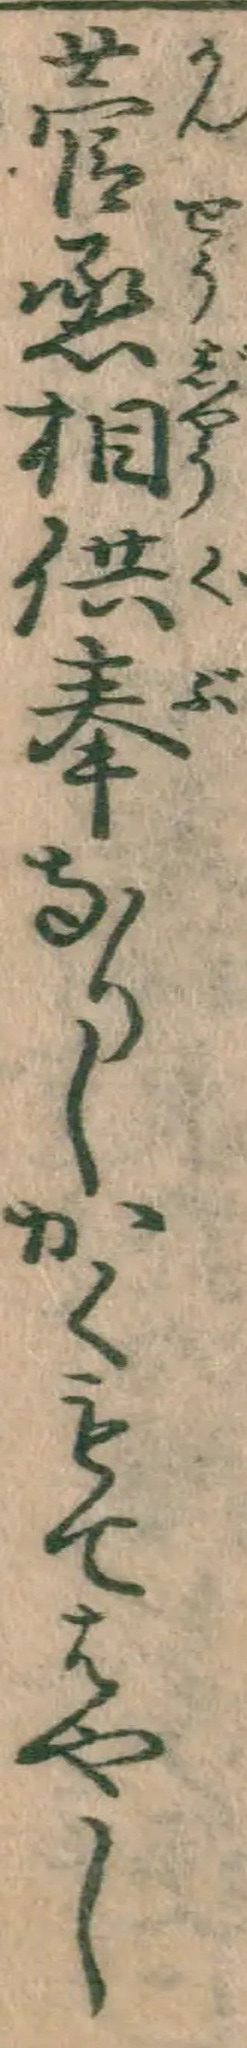菅烝相供奉なりしかくもてはやし
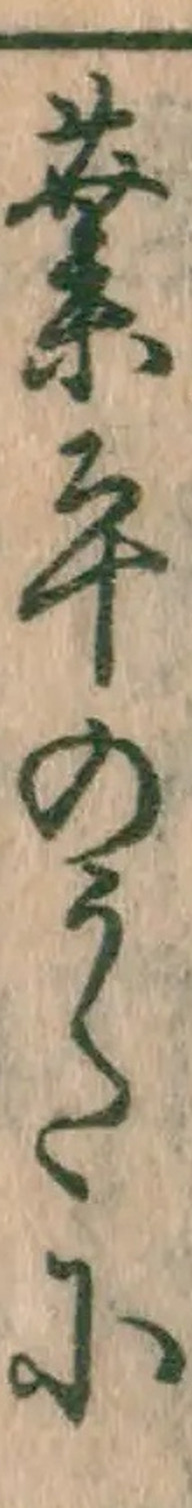業平のうたに
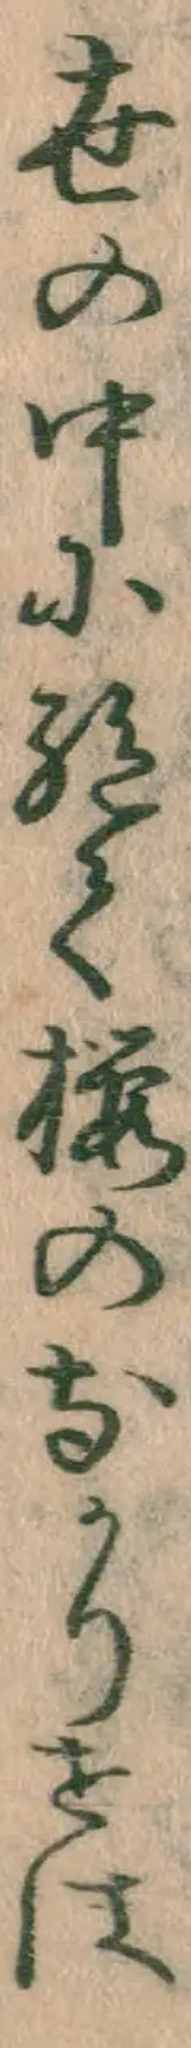世の中に絶て桜のなかりせは
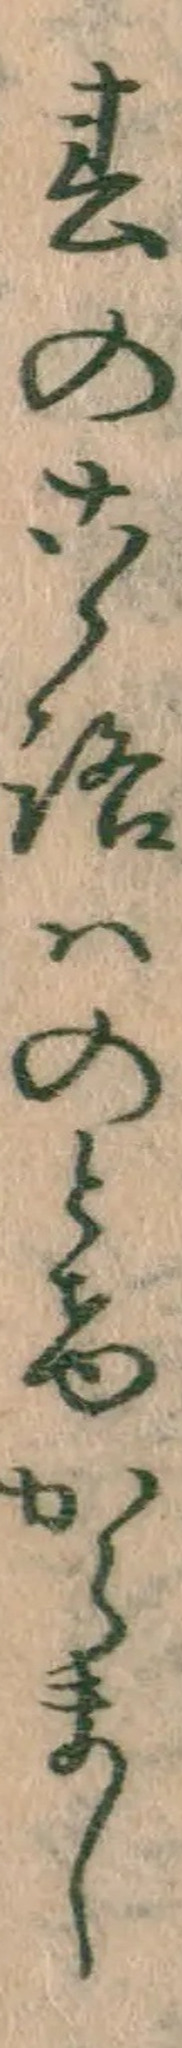春のこゝろはのとけからまし
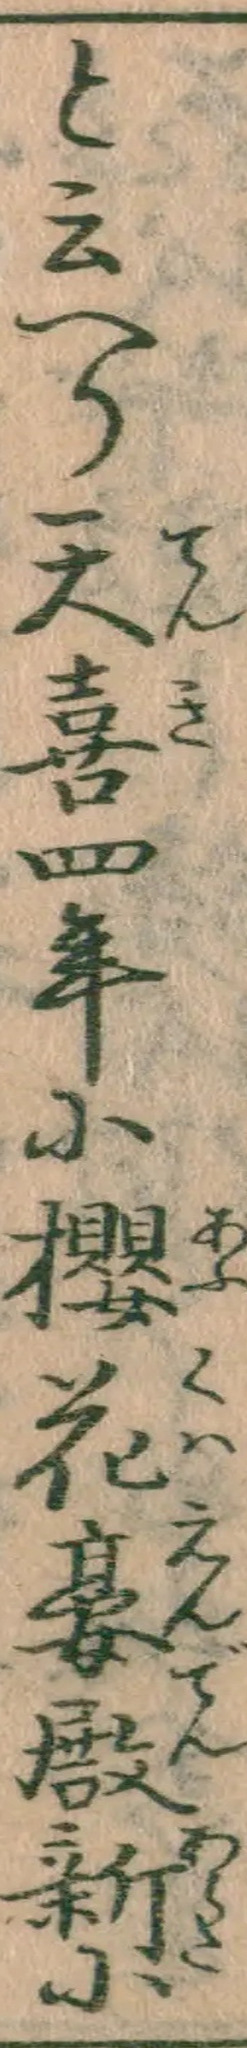と云へり天喜四年に桜花宴殿新に
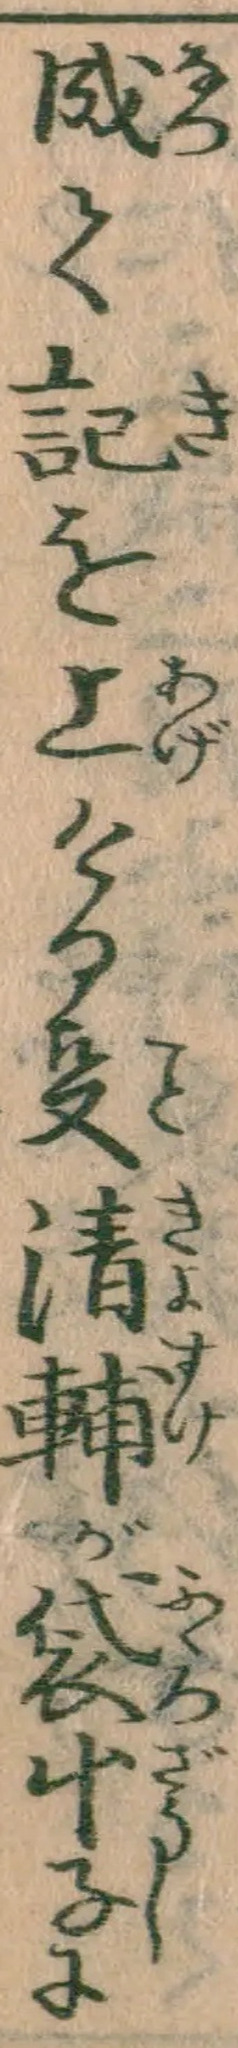成て記を上ける事清輔が袋草子に
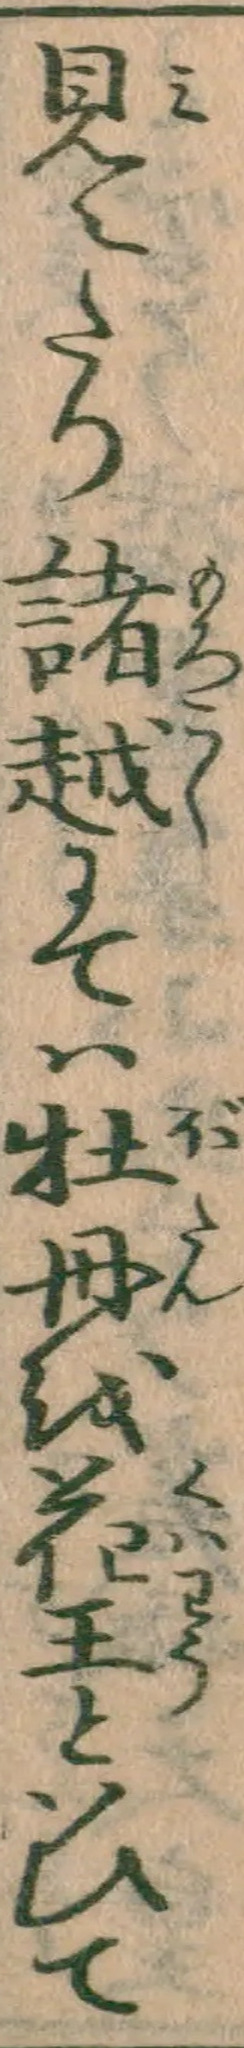見えたり諸越にては牡丹を花王といひて
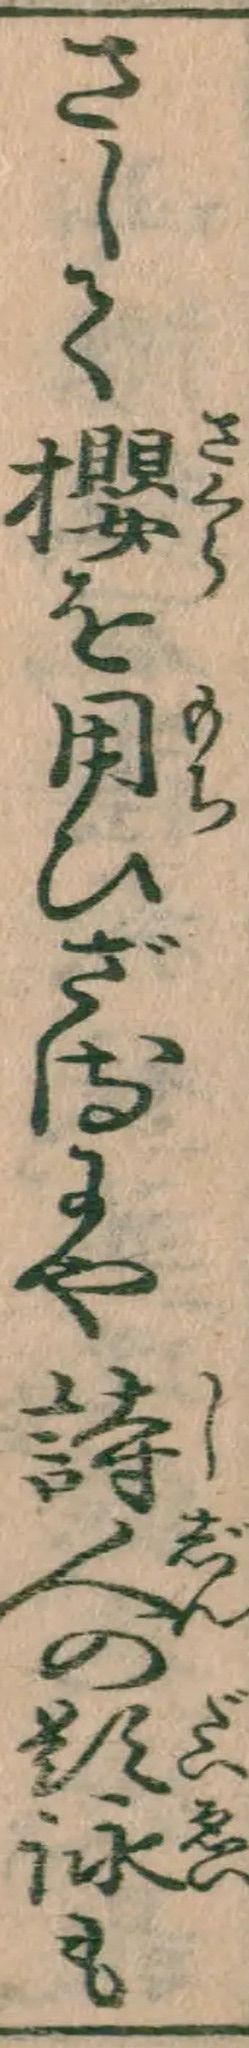さして桜を用ひざるにや詩人の題詠も
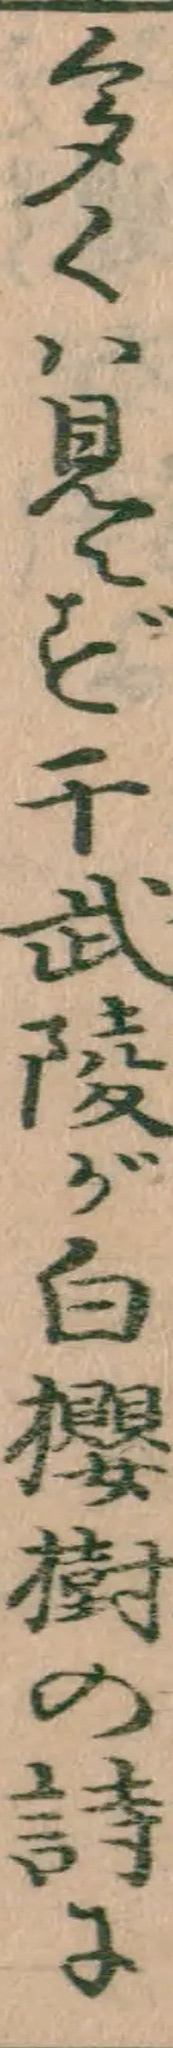多くは見えず干武陵が白桜樹の詩に
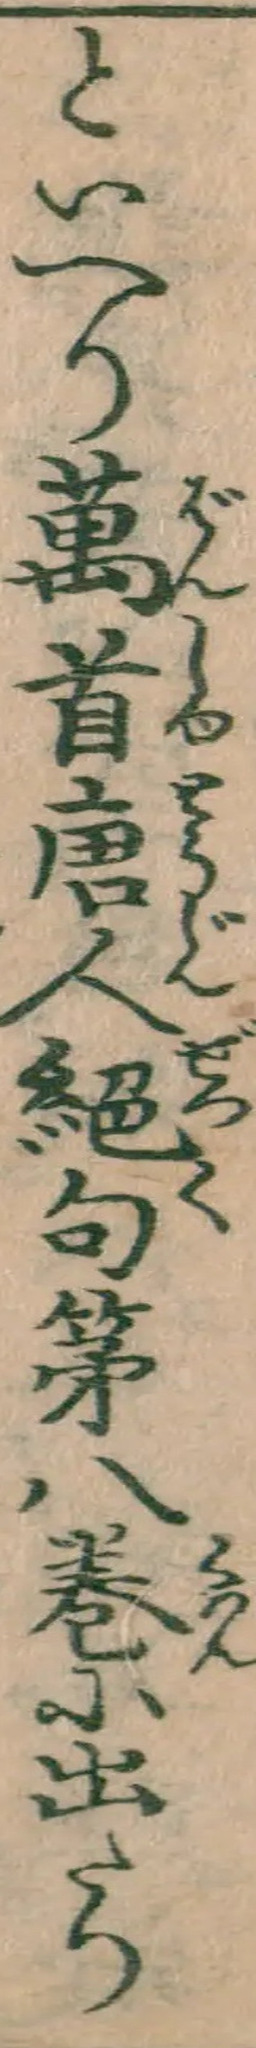といへり万首唐人絶句第八巻に出たり

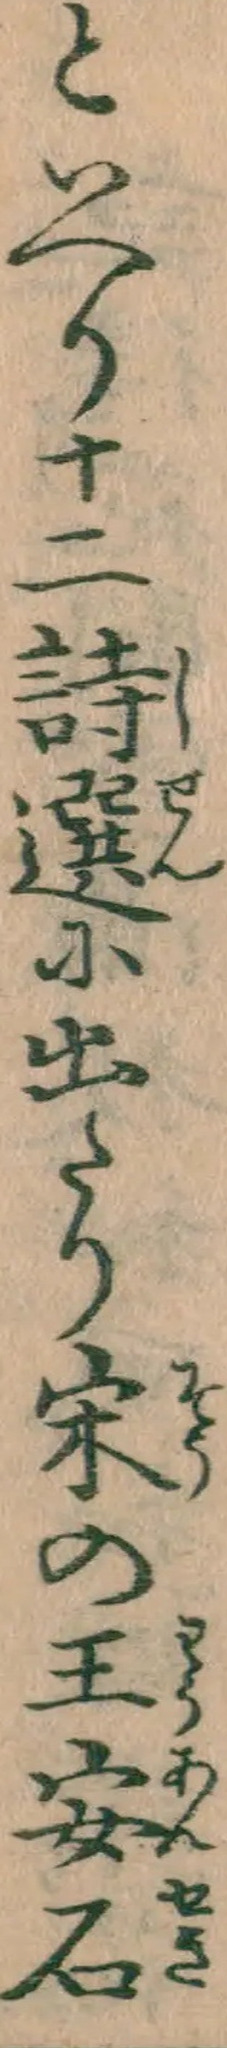といへり十二詩選に出たり宋の王安石
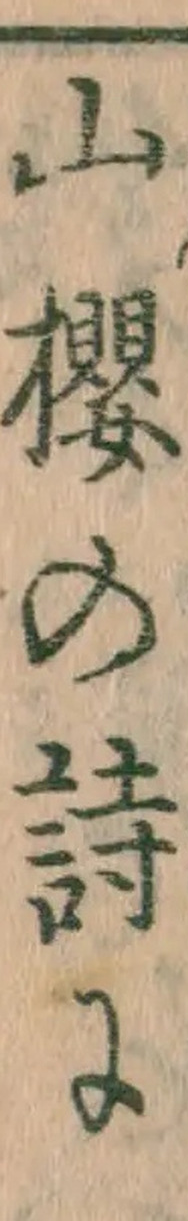山桜の詩に
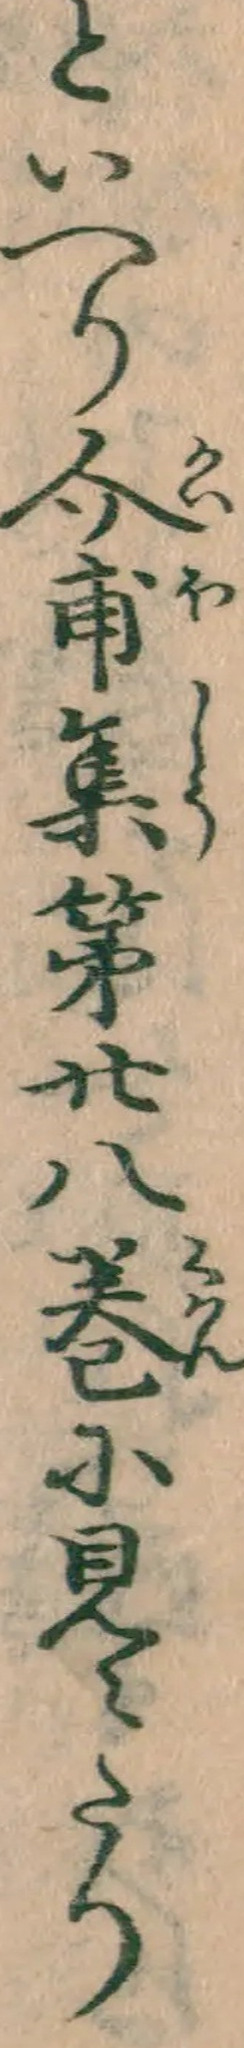といへり介甫集第廿八巻に見えたり
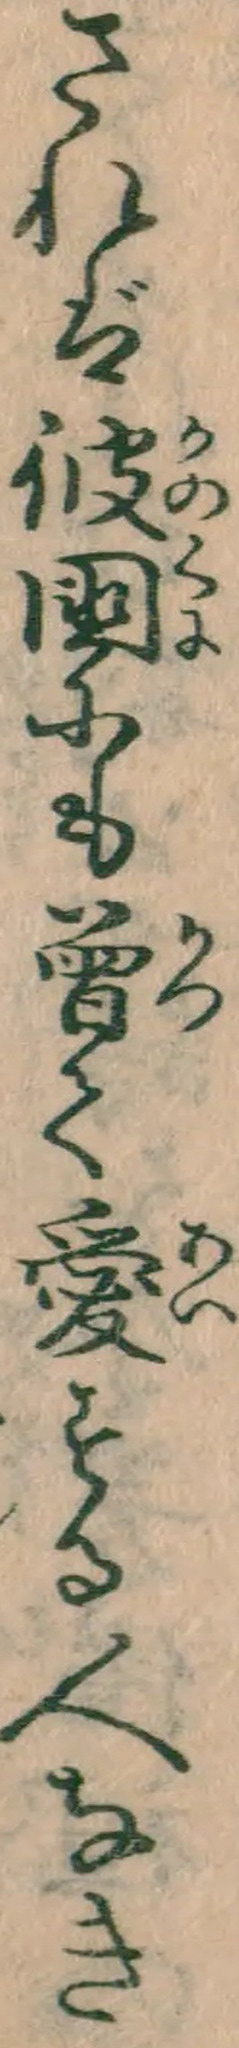されば彼国にも曽て愛する人なき
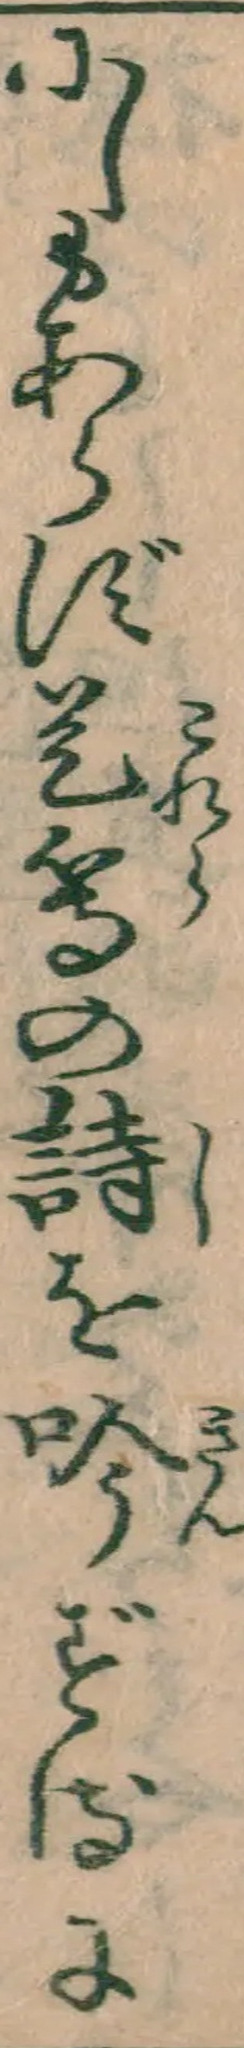にしもあらず是等の詩を吟ずるに
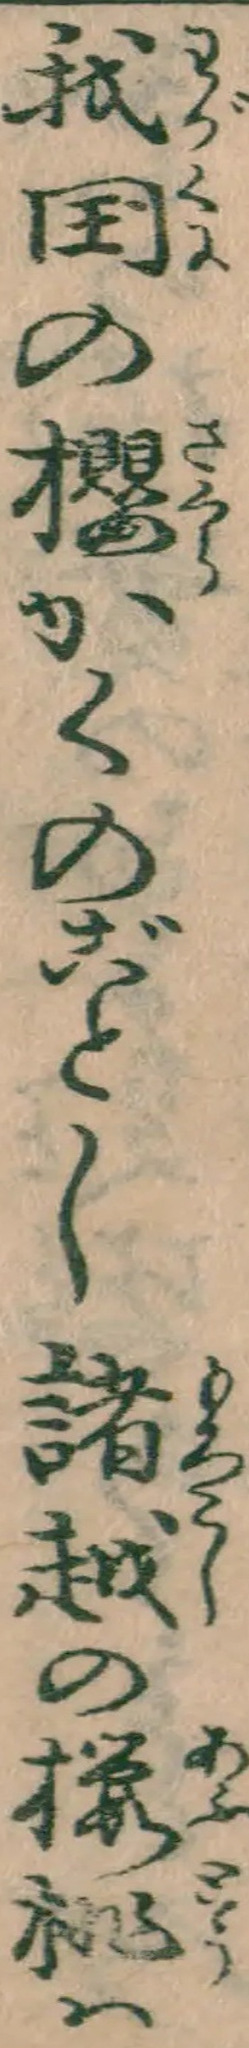我国の桜かくのごとし諸越の桜桃は
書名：怡顔齋櫻品
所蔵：国立国会図書館 National Diet Library, JAPAN
